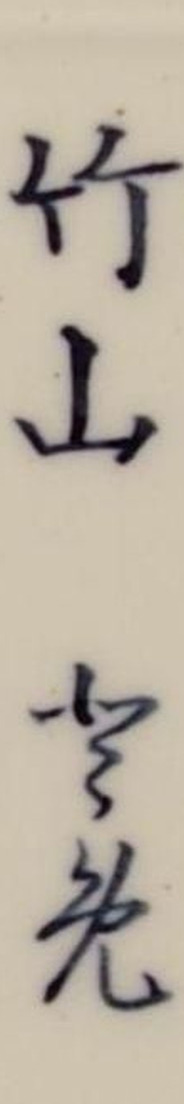竹山とめ
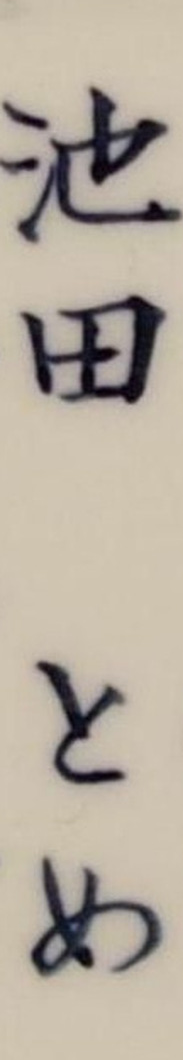池田とめ
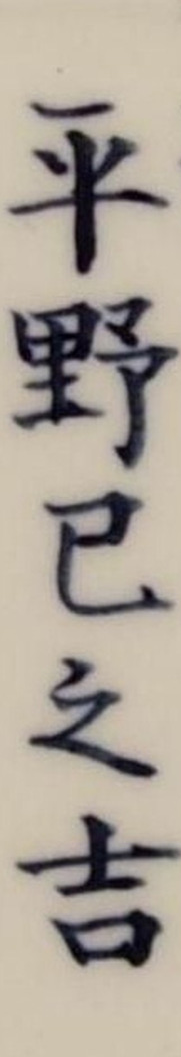平野巳之吉
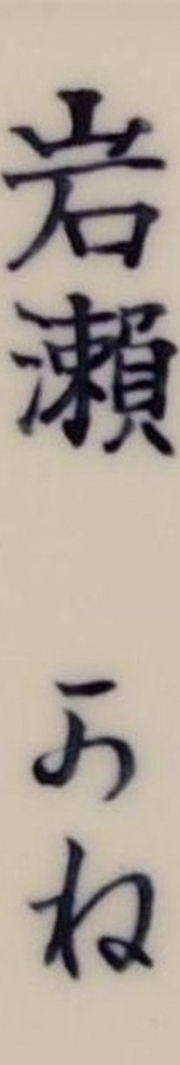岩瀬かね
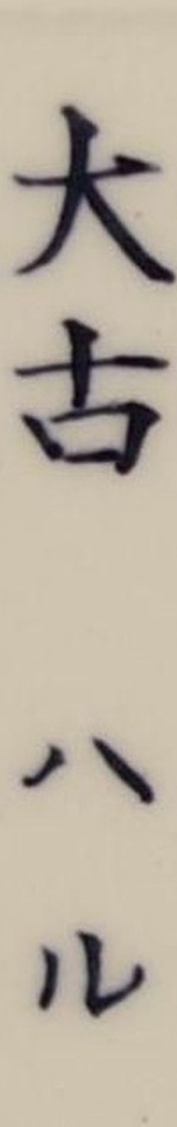大古ハル
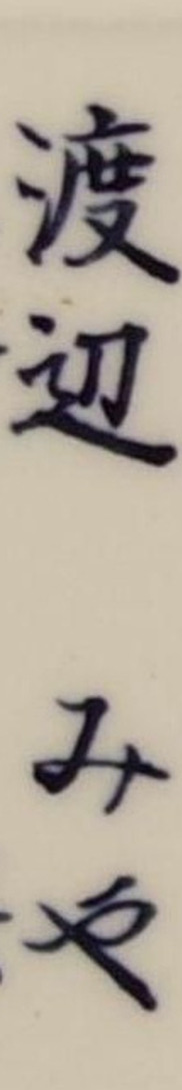渡辺みや
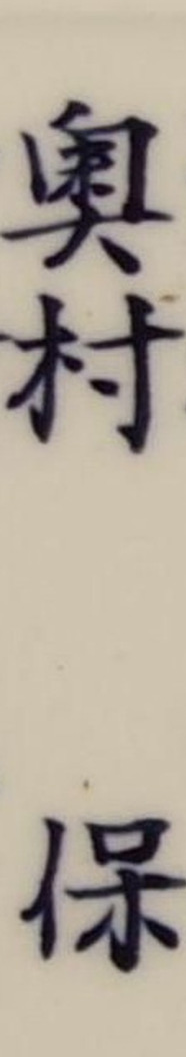奥村保
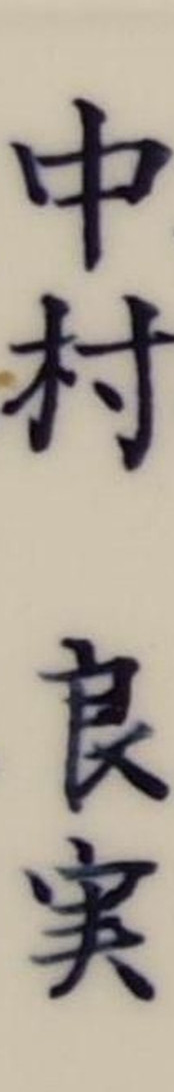中村良実
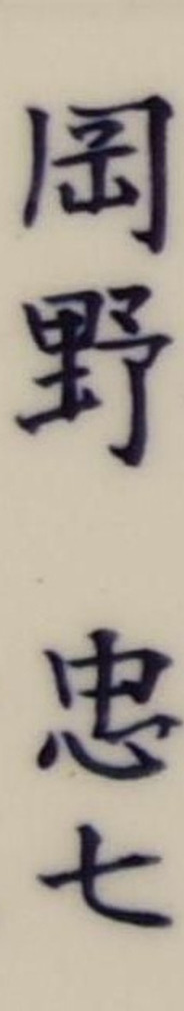岡野忠七
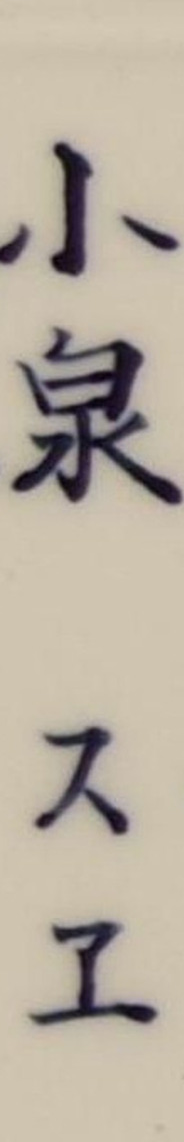小泉スエ
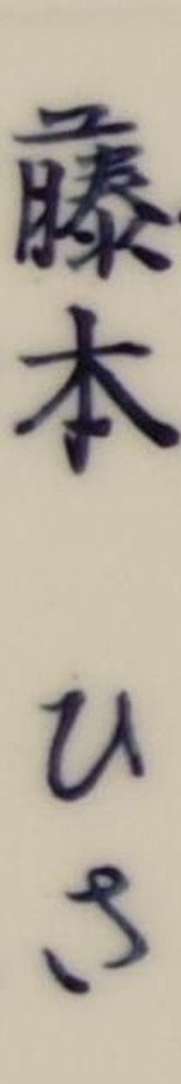藤本ひさ
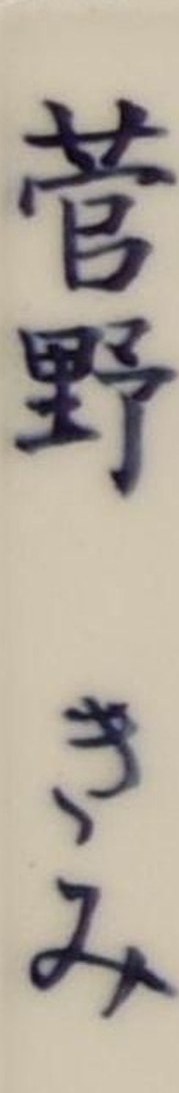菅野きみ

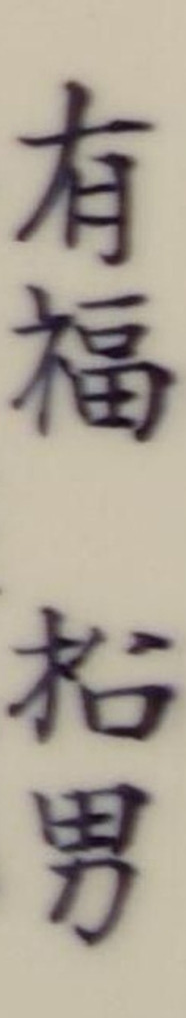有福松男
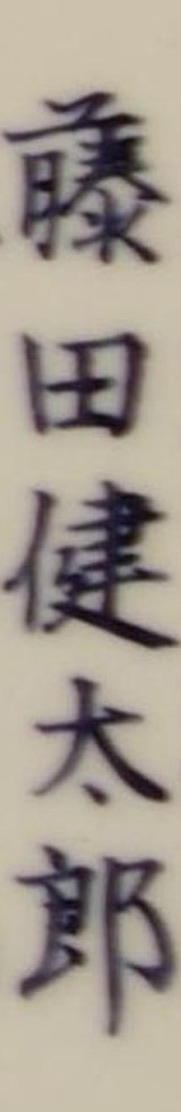藤田健太郎
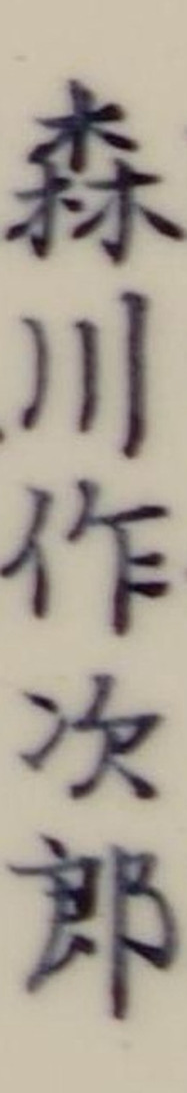森川作次郎
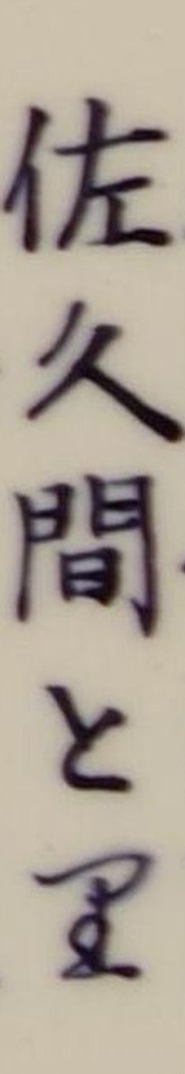佐久間とり
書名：E~L
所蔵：高野山金剛峯寺
